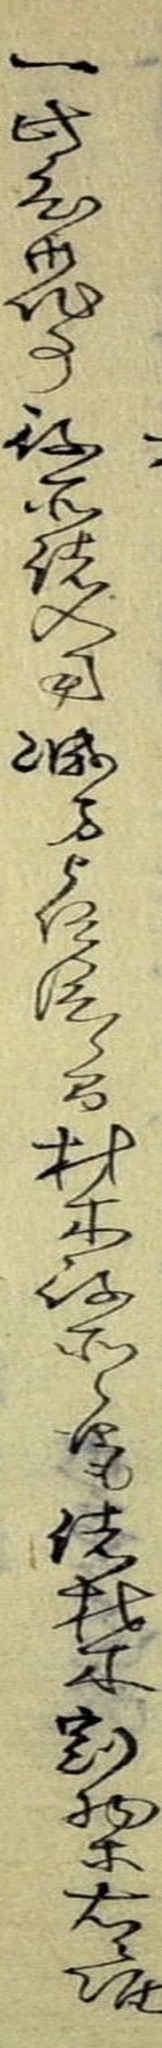一此度御作事役所諸入用減方被仰渡候間材木役所之儀も諸材木割物等右ニ准
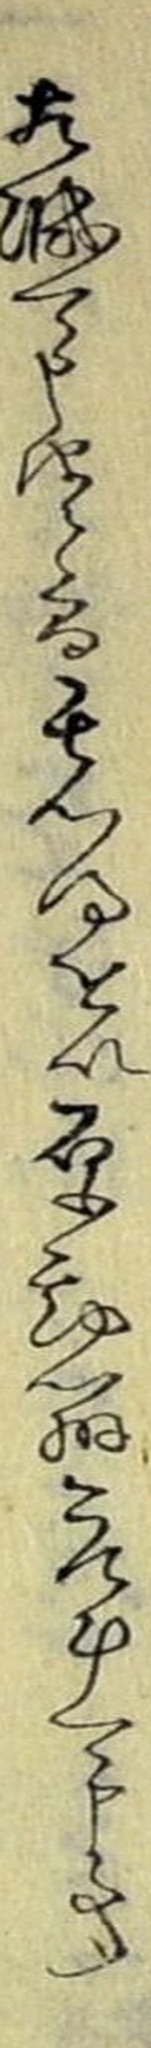相減可申儀候間其心得を以厚勘弁取計可申事
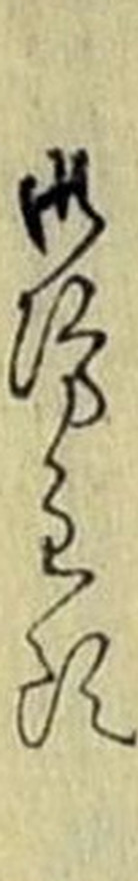御坊主頭
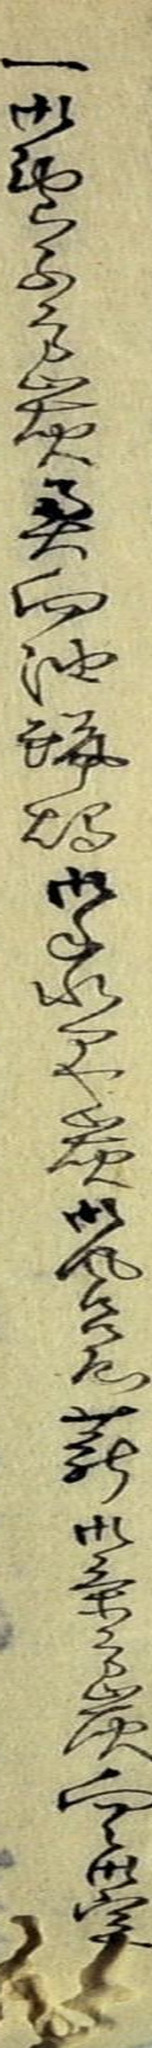一御台子方炭奥向油蝋燭御手水部ヤ炭御風呂屋薪御茶方炭向々御定
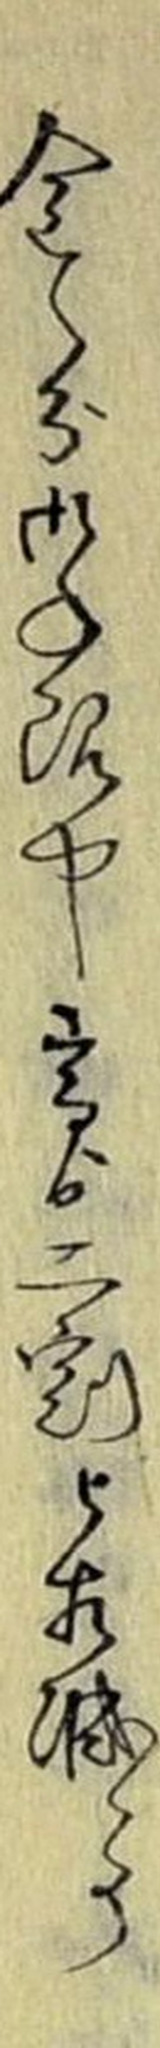金之分御年限中高ゟ二割被相減事
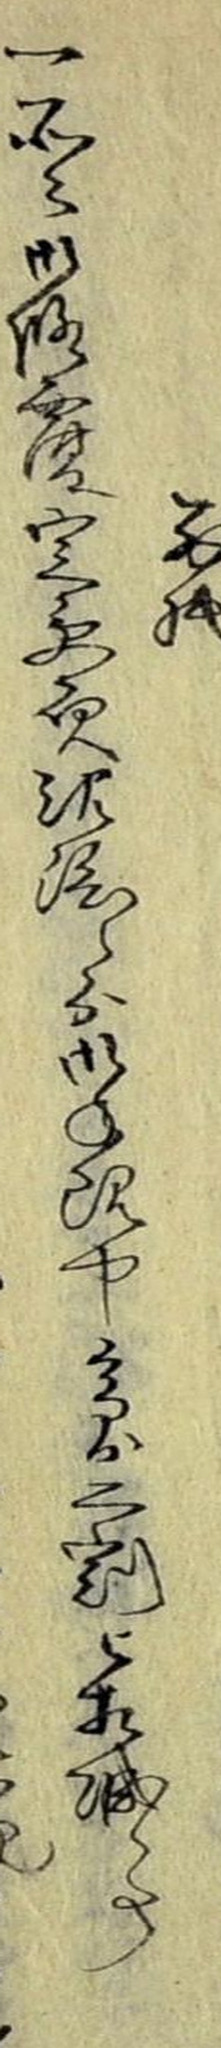一所々御修覆定受負銀渡候分御年限中高ゟ二割被相減候事
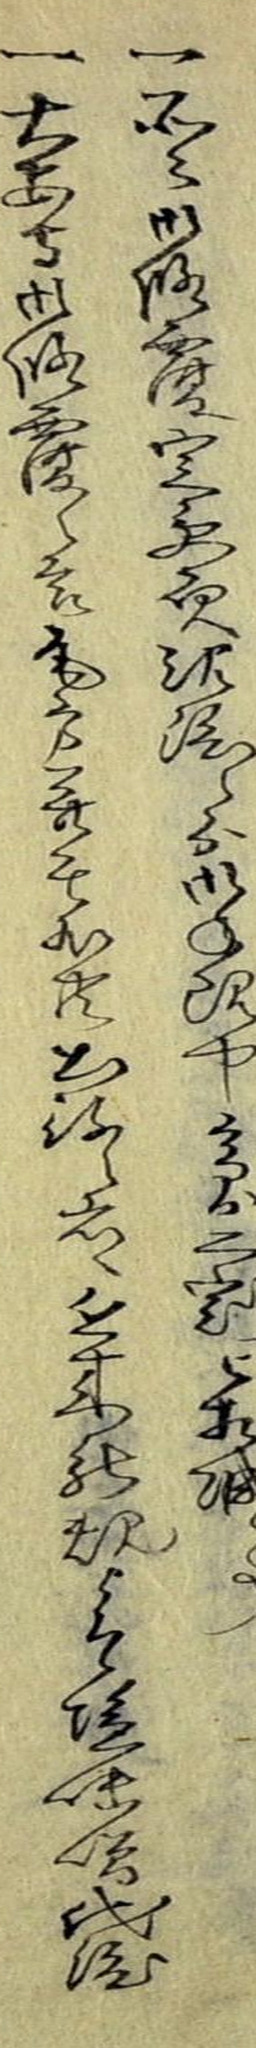一大安寺御修覆之節瓦方并其外共出役之者へ近来新規被下候塩味噌代渡
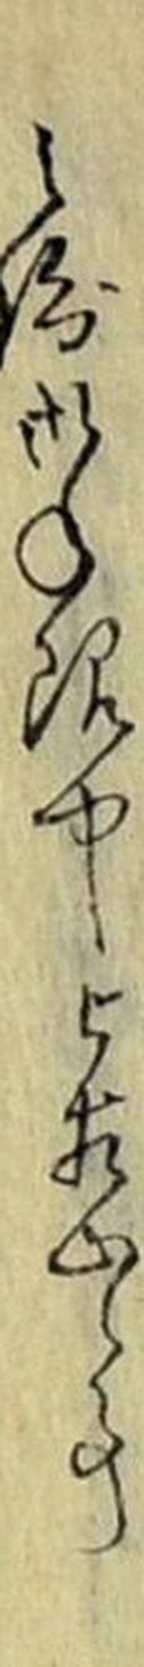之儀御年限中被相止候事
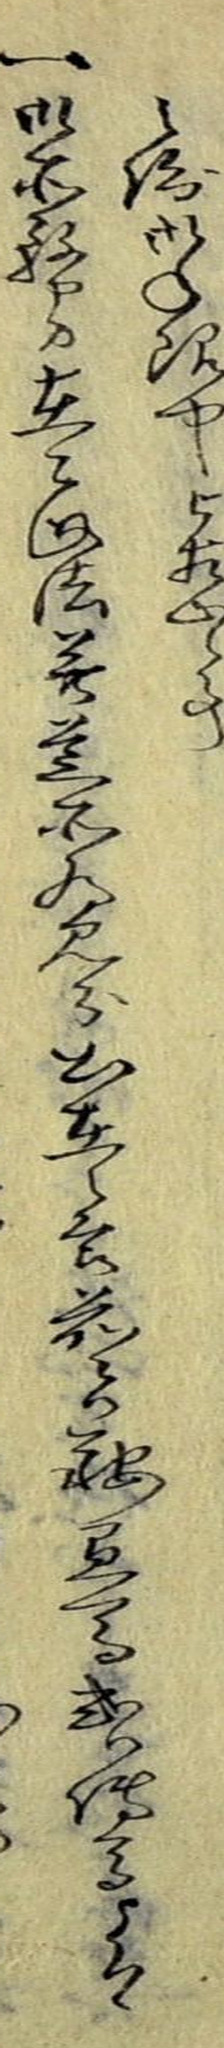一御所務方在々趣法并荒所為見分出在之節前々ハ鞍置馬或ハ伝馬被下候
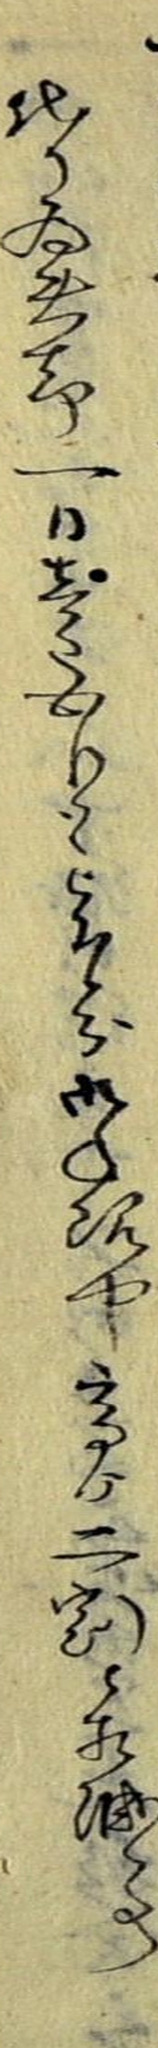代り為失却一日壱匁五歩ツヽ被下候分御年限中高ゟ二割被相減候事

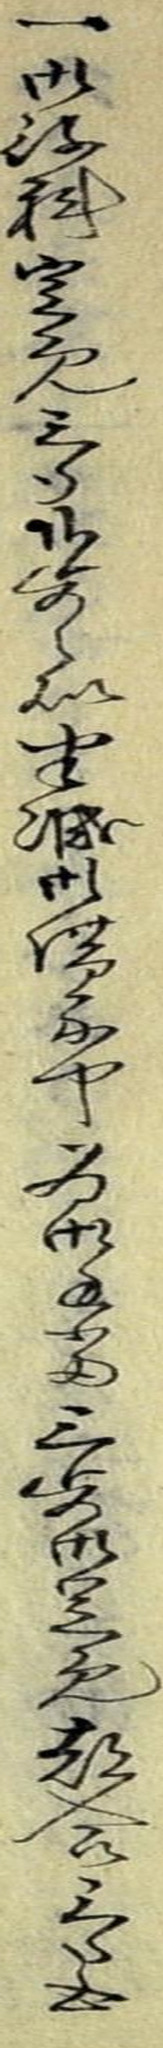一御役料定免三ツ弐歩之処半減御借米中為御手当三歩御定免都合三ツ五
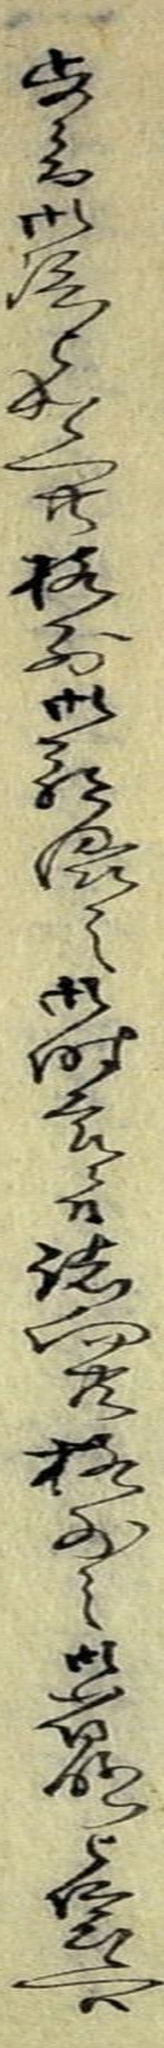歩ニ而御渡被成候へ共格別御難渋之御時節ニ付諸向共格別之御省略被仰出候へハ
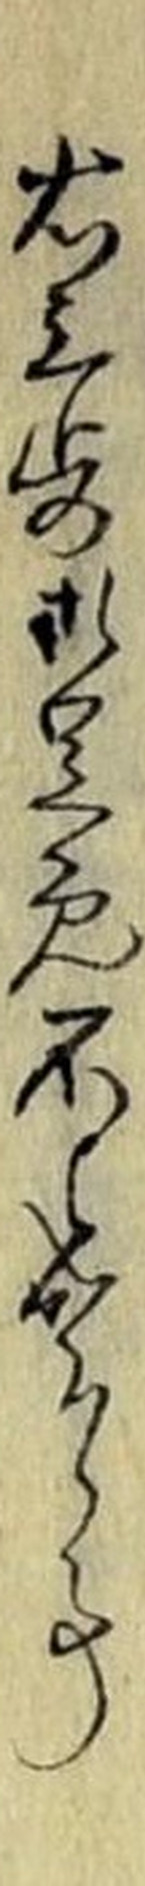右三歩御足免不被成下候事
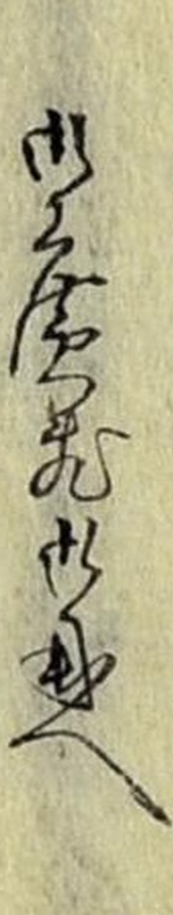御広敷御用人
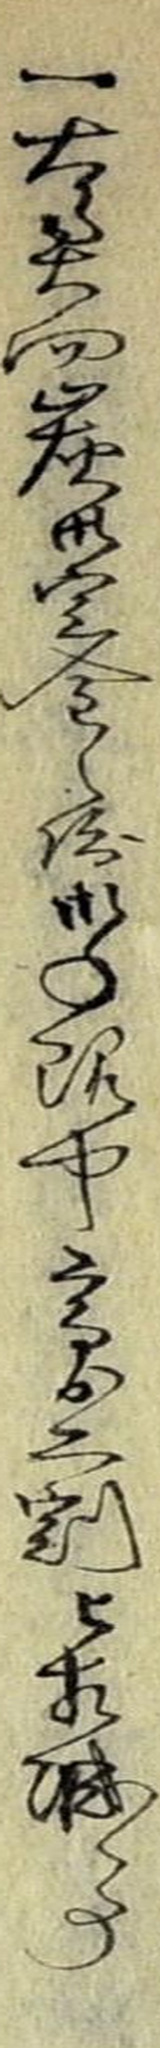一右奥向炭御定金之儀御年限中高ゟ二割被相減候事
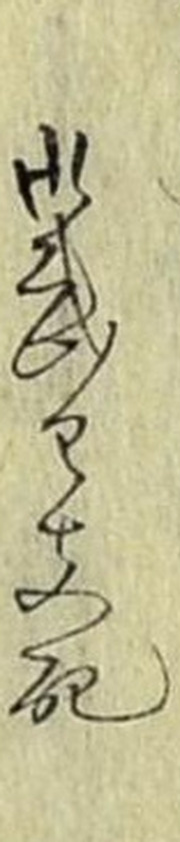御武具支配
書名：命令之部 五
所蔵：福井県文書館 Fukui Prefectural Archives
